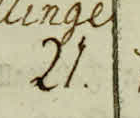21.
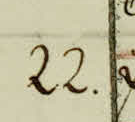22.
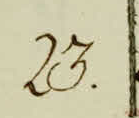23.
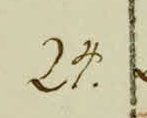24.
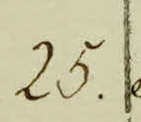25.
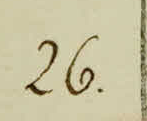26.
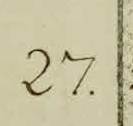27.
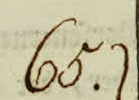65.
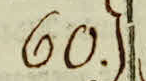60.
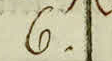6.
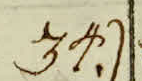34.
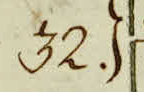32.
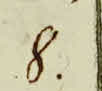8.
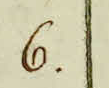6.
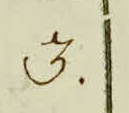3.
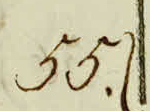55.
